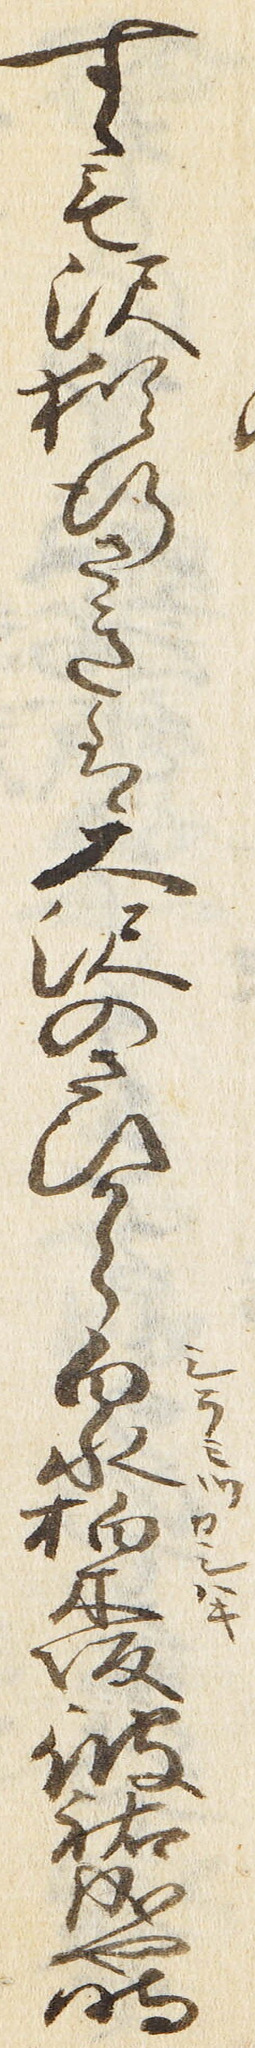すゝも沢猶行さきは大沢のさひから白水柏木坂彼祐成や時
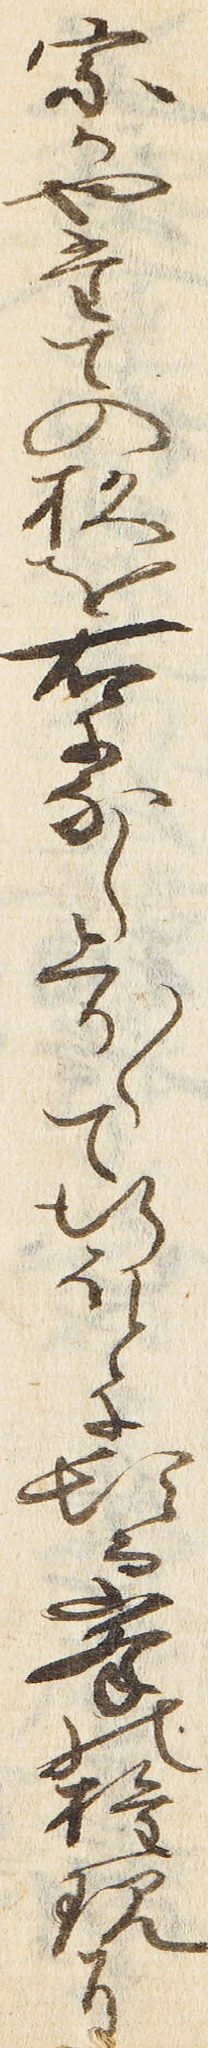宗かやたての杉を右になし上り〳〵て行ほとに頓而峯の権現に
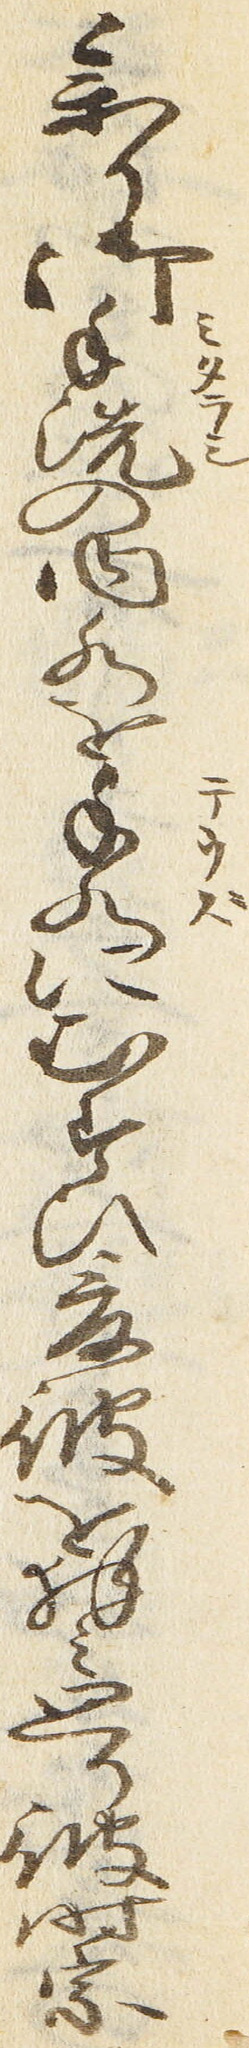参り御手洗の内水を手水にむすひ爰彼を拝み廻り彼時宗
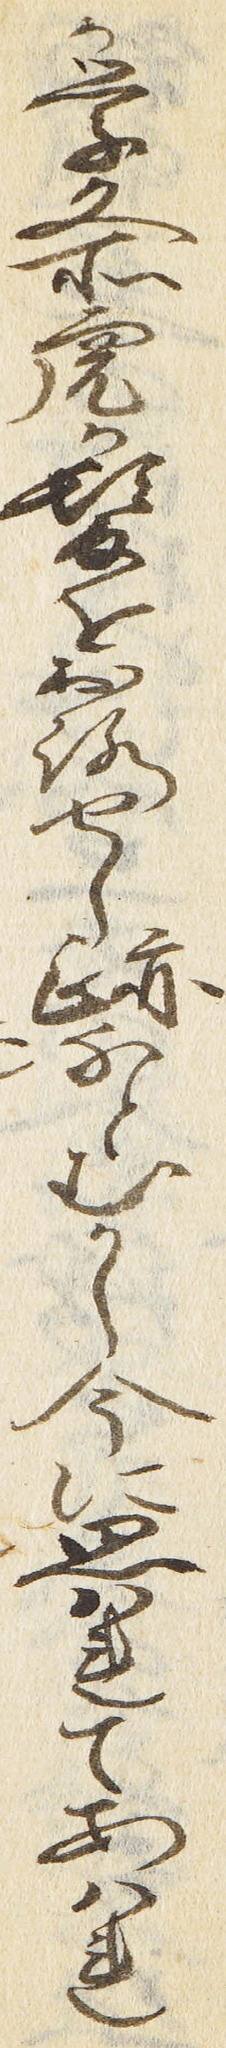か学文所虎か髪をおろせし跡なとむかし今に思はれてあはれ
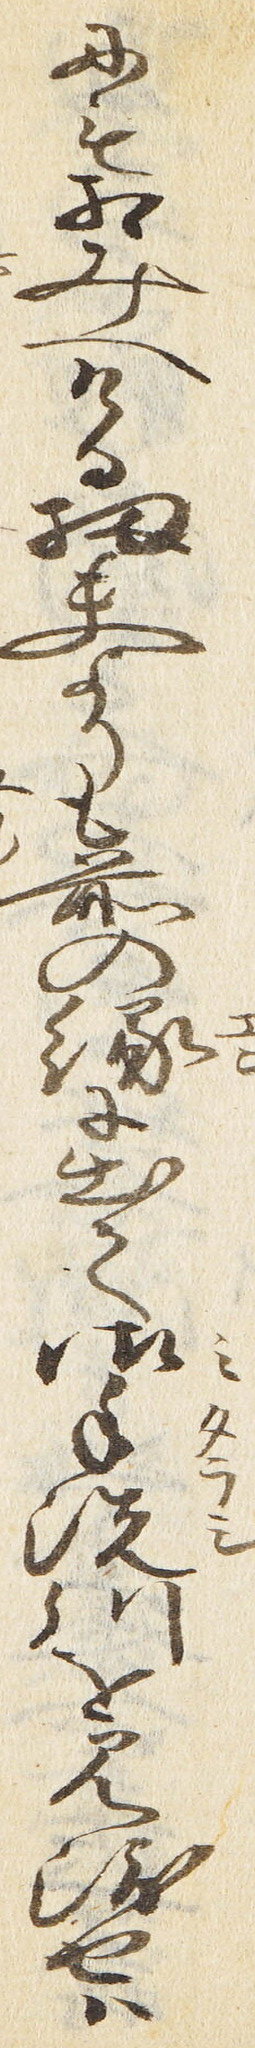にも相みへける扨夫よりも前の縁に出て御手洗川を見渡せは
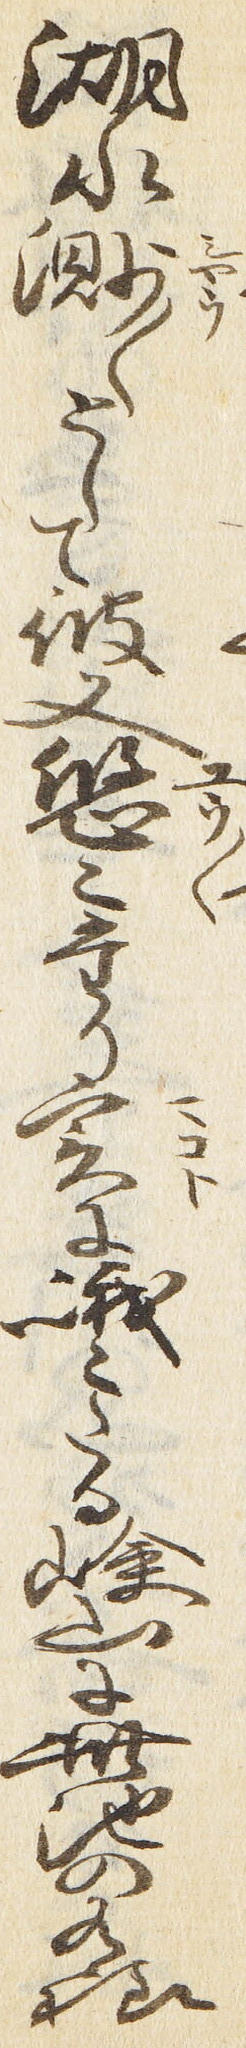湖水渺〳〵？として彼又悠々たり実に峨々たる嶮山に此池の有様
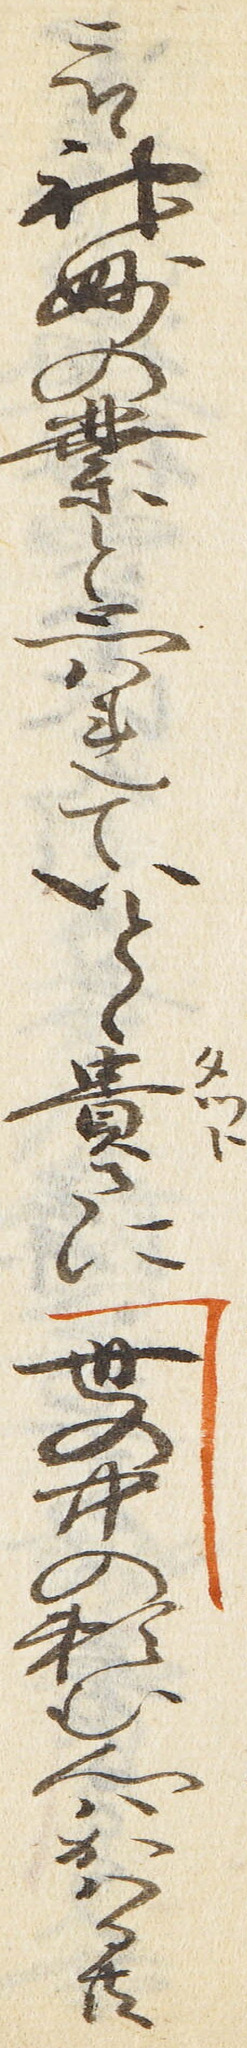こそ神妙の業と思はれていとゝ貴さに「世の中の頼む心はかはる共
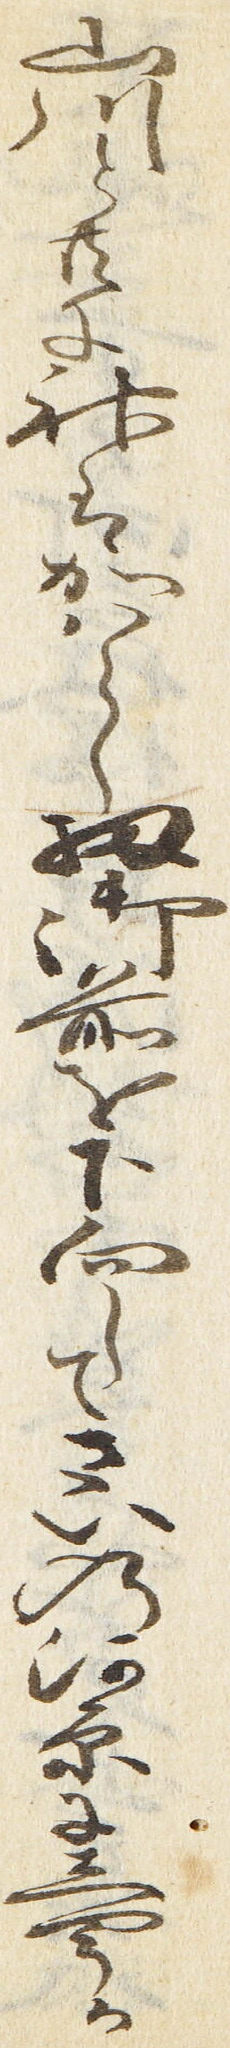山川と共に神はかはらし扨御前を下向してさいの河原にしやうか
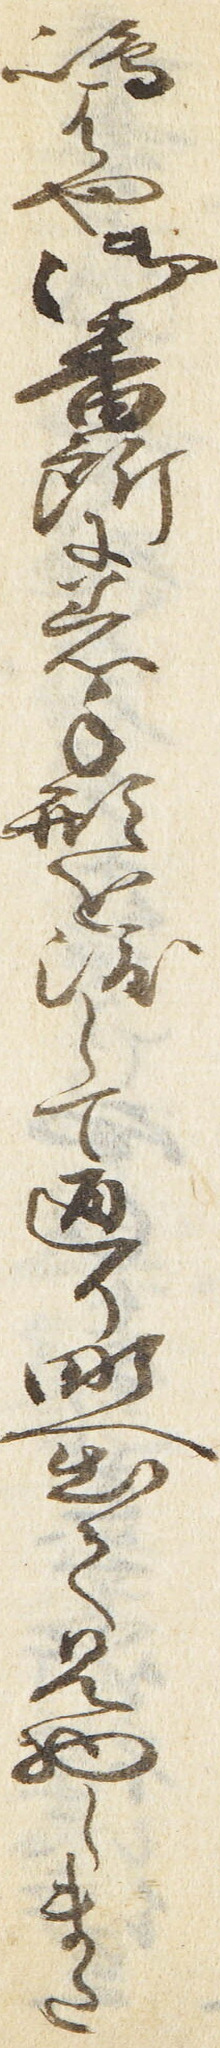嶋はや御番所に着手形を渡して通り町へ出て見物しまた
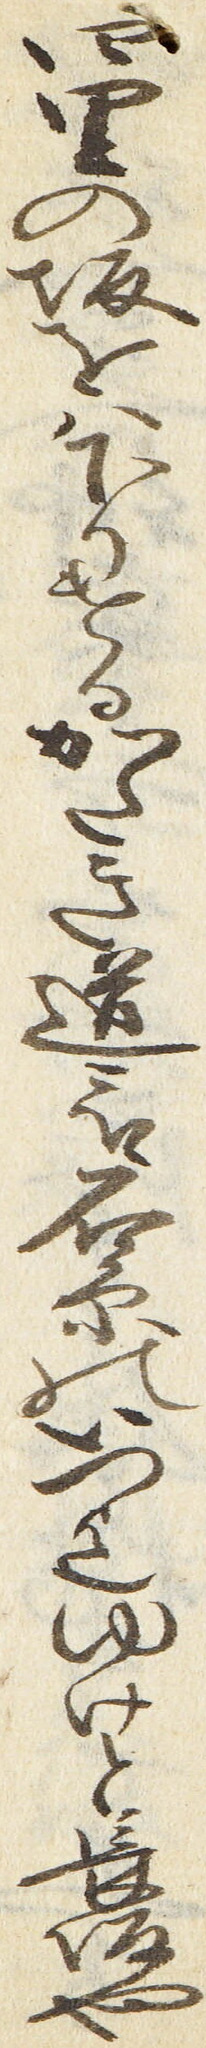四里の坂をは下りけるかたき道こそ石原のいつ迄ゆけと長坂や
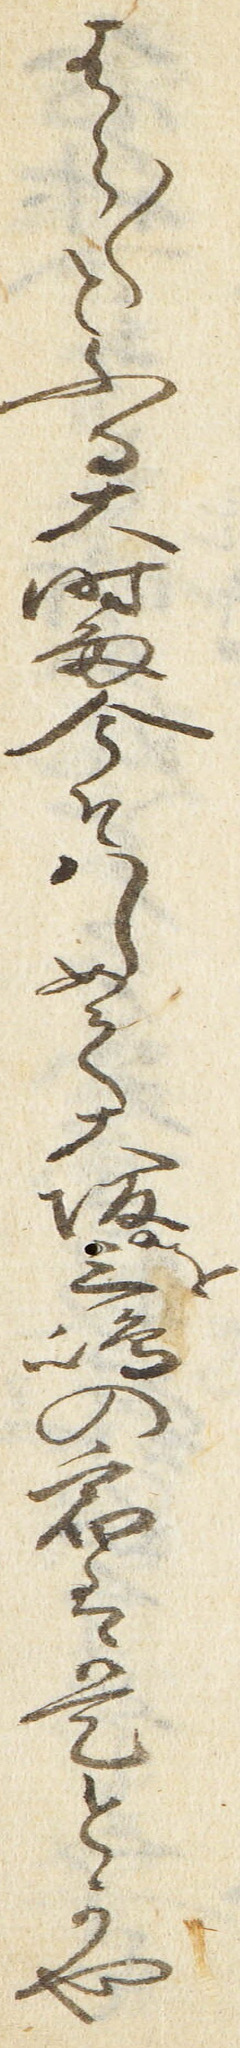はら〳〵とふる大時雨今そはしめて大坂を三嶋の宿は是とかや

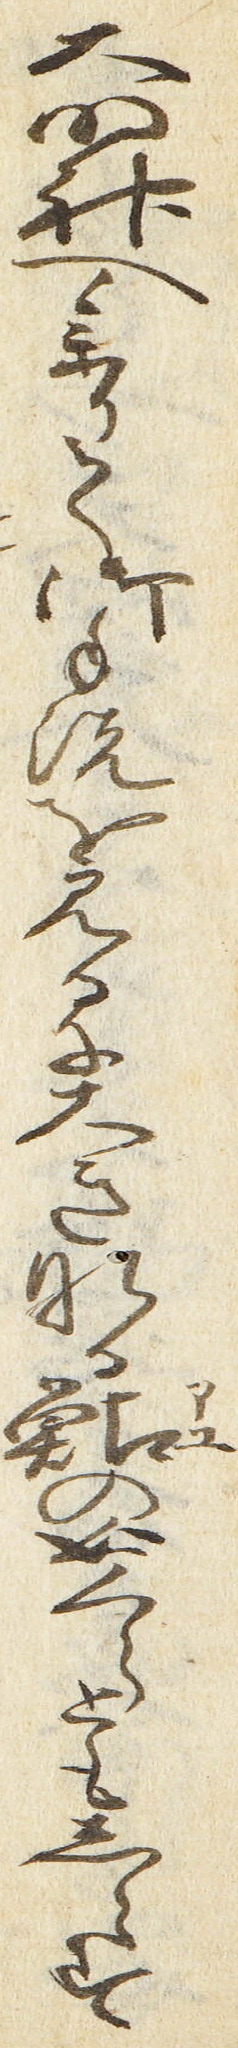大明神へ参りて御手洗を見るに大きなる鮎のいくらともしらす
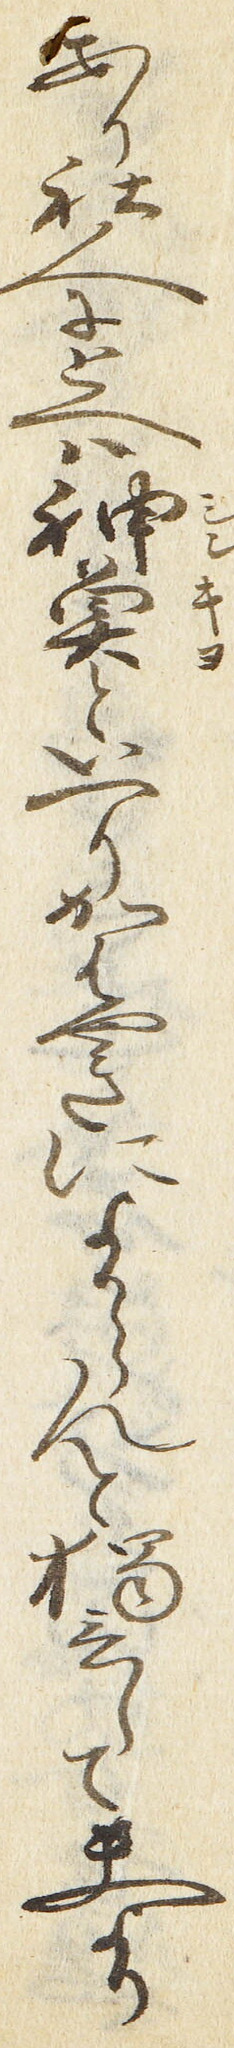あり社人にとへは神魚といへりかはやきによからんと独言して夫より
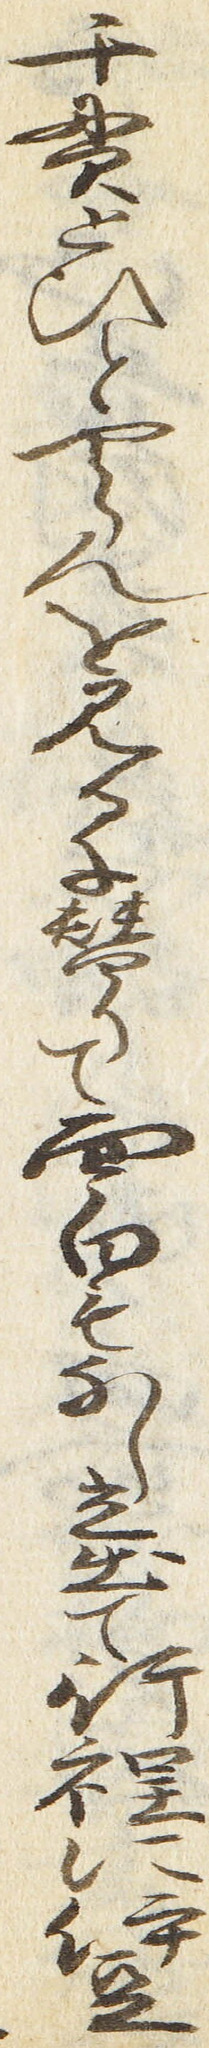千貫とひとやらんを見るに替りて面白もなし立出て行程に伊豆
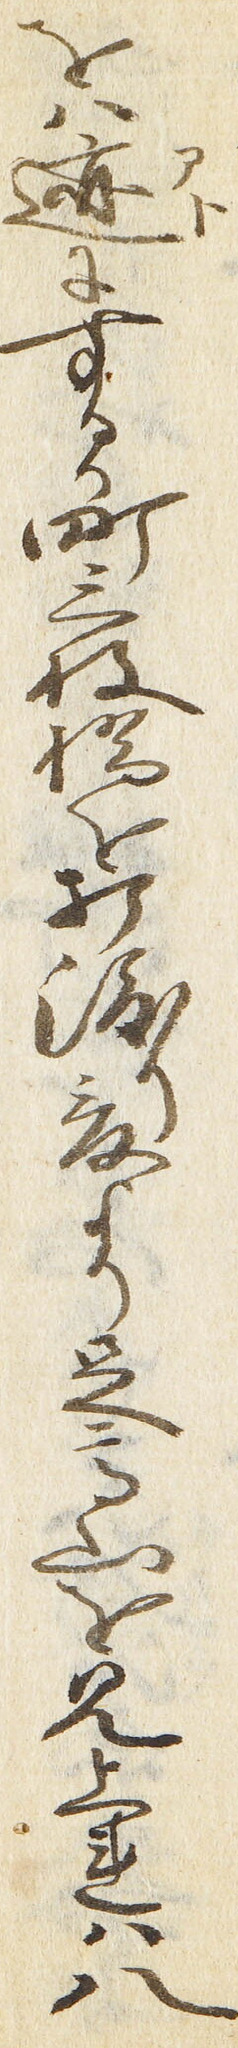をは迹にするか町三枚橋を打渡り爰より足高山を見上れは八
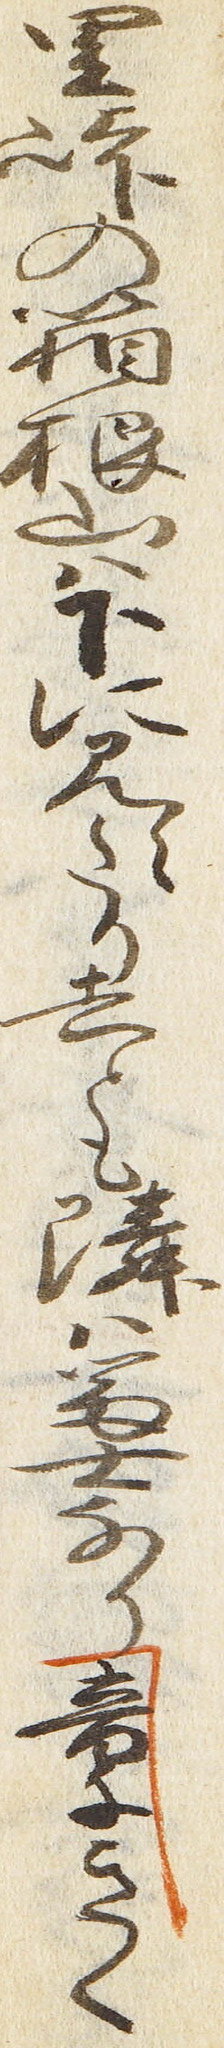里峠の箱根山は下に見えたり去とも隣は富士なり「音にきく
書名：海陸世話日記
